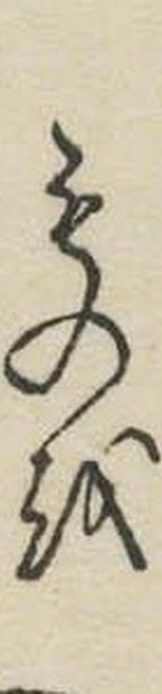ものを
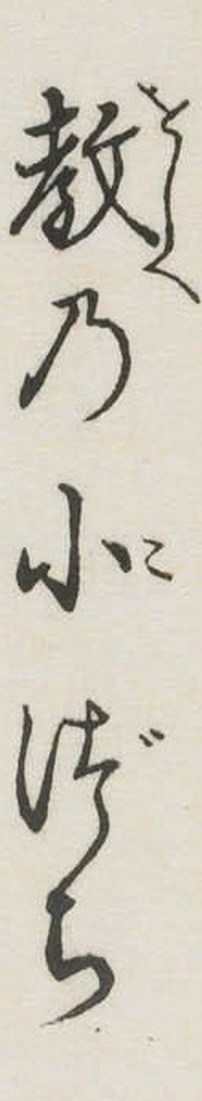教の小づち
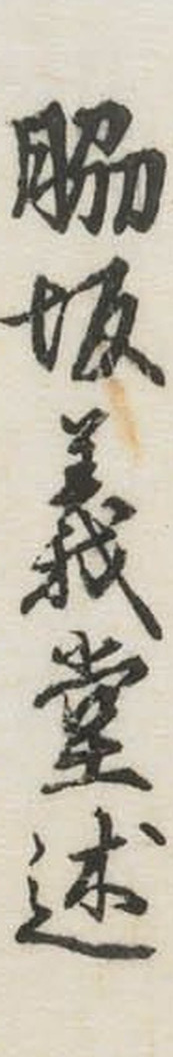脇坂義堂述
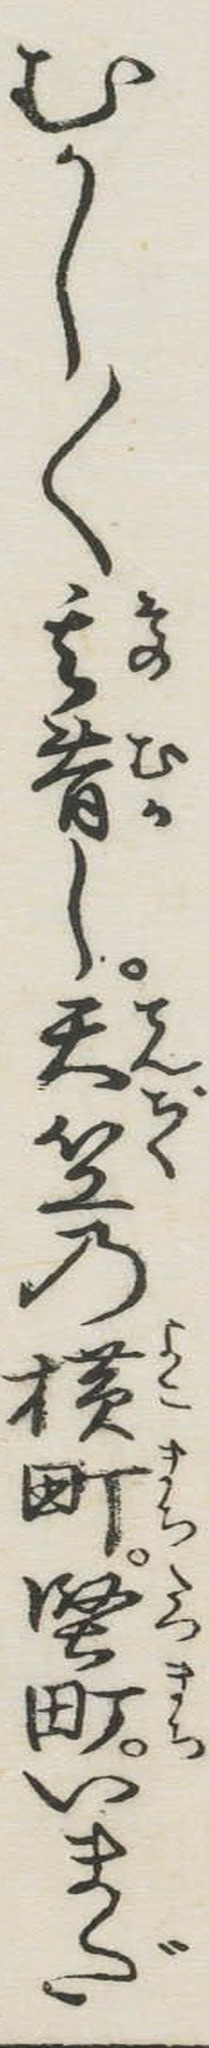むかし〳〵其昔し。天竺の横町。堅町。いまだ
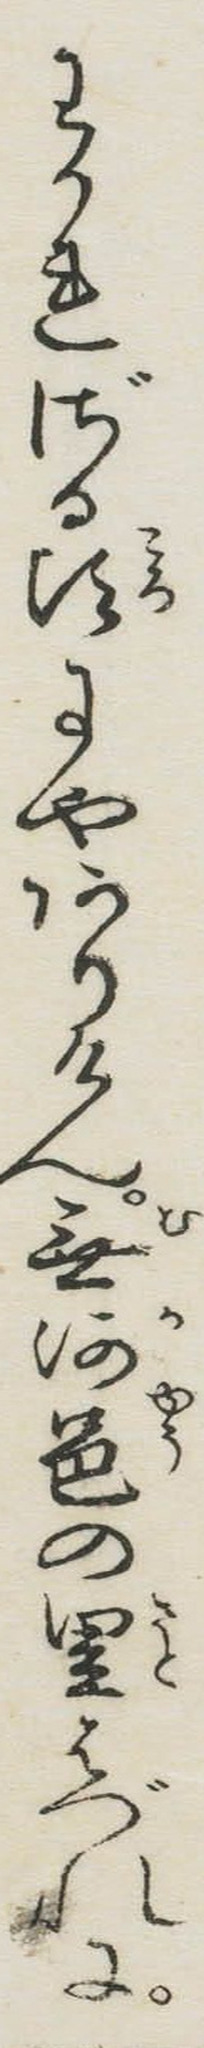わかれざる頃にやありけん。無河邑の里はづれに。
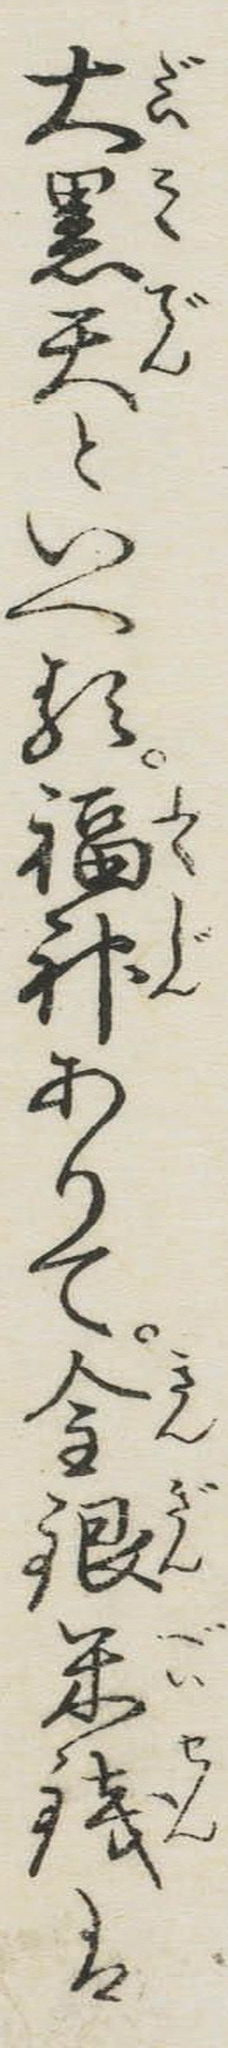大黒天といへる。福神ありて。金銀米銭は
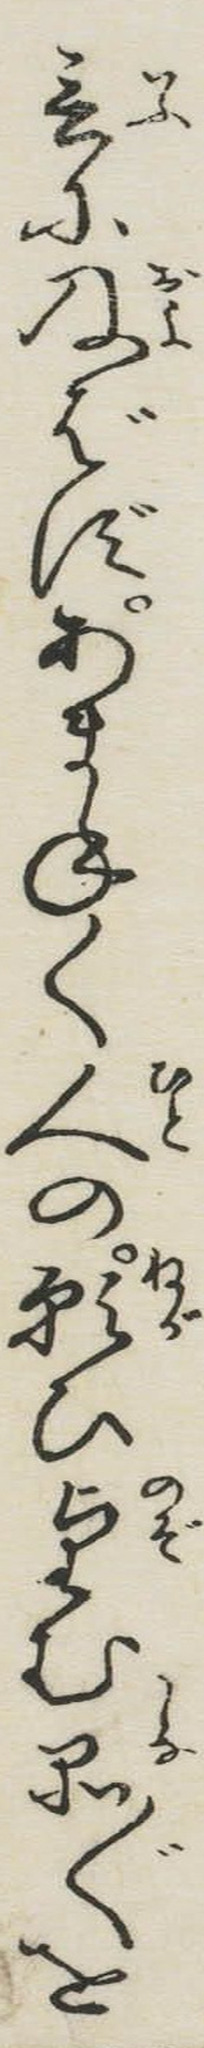言に及ばず。あまねく人の。願ひ望む品〴〵を
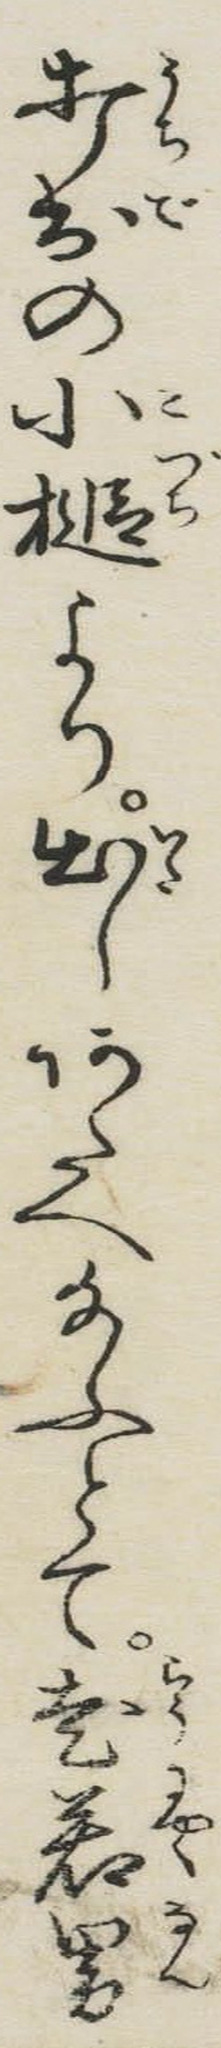打出の小槌より。出しあたへ給ふとて。老若男
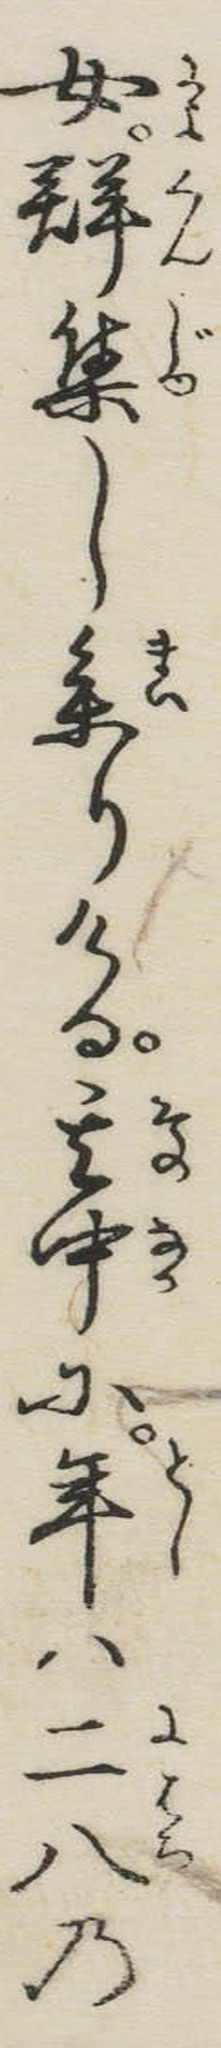女。群集し参りける。其中に。年は二八の

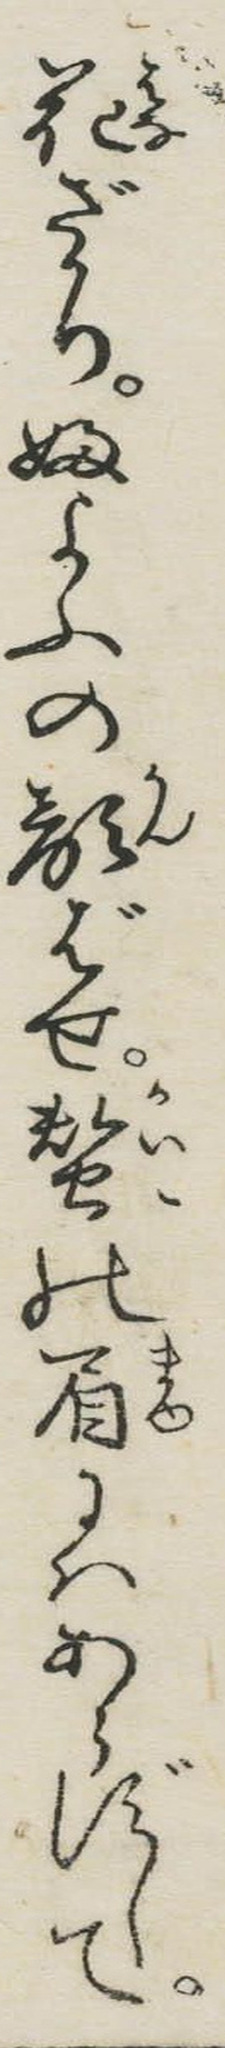花ざかり。ふよふの顔ばせ。蠶の眉にはあらずして。
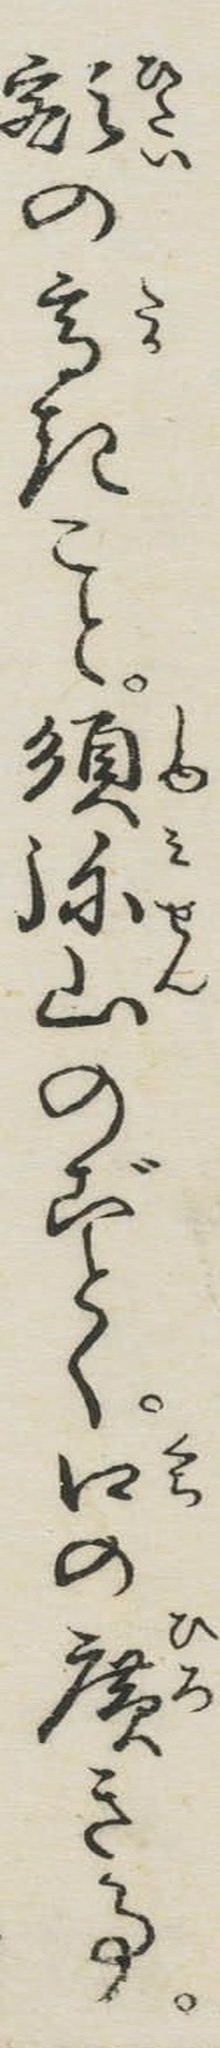額の高きこと。須弥山のごとく。口の広き事。
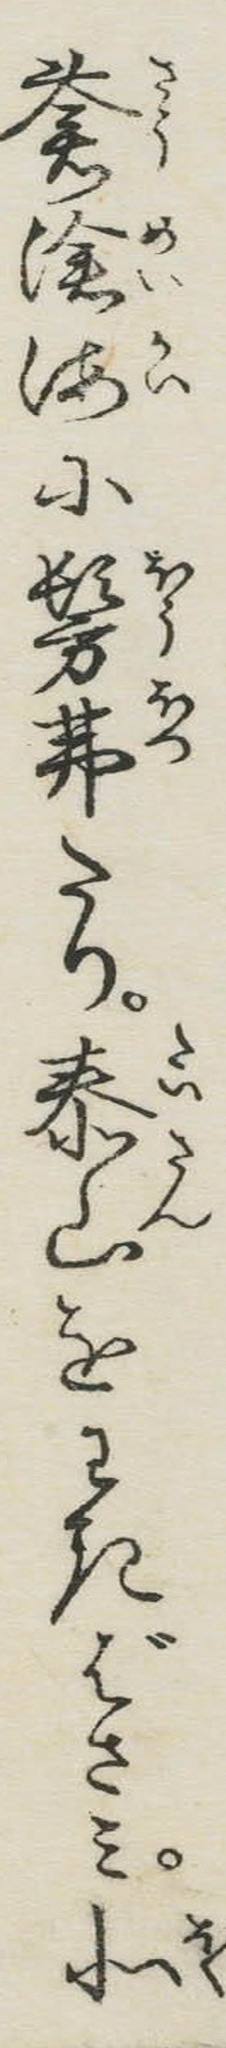蒼溟海に髣弗たり。泰山をわきばさみ。北
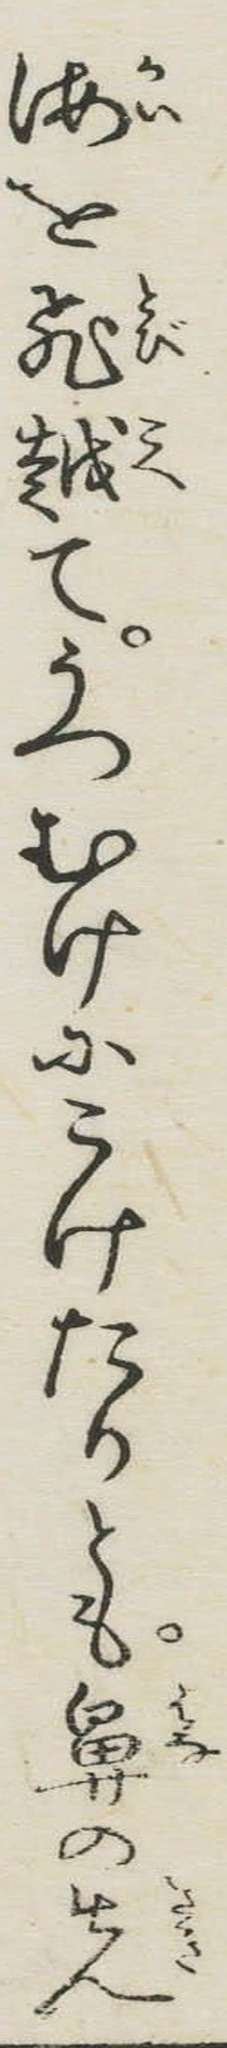海を飛越て。うつむけにこけたりとも。鼻の先
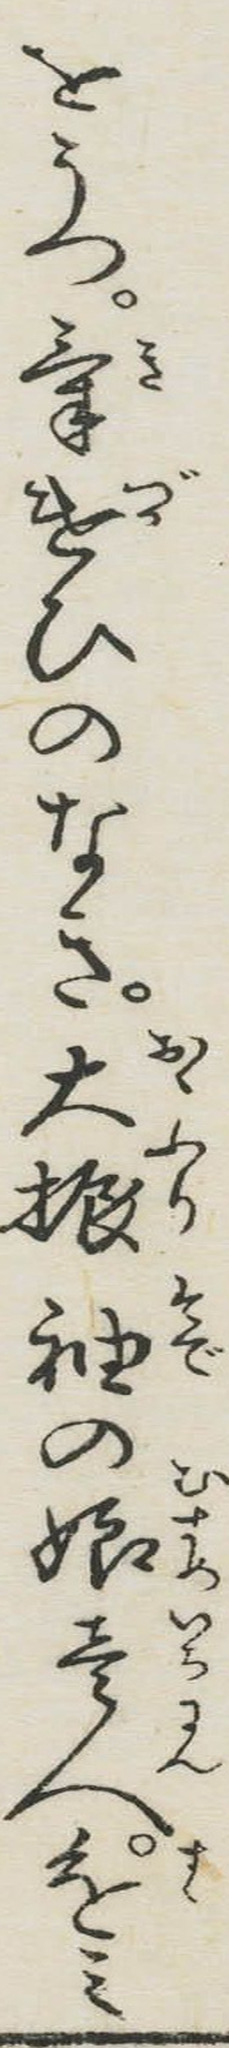をうつ。気遣ひのなき。大振袖の娘壱人。進み
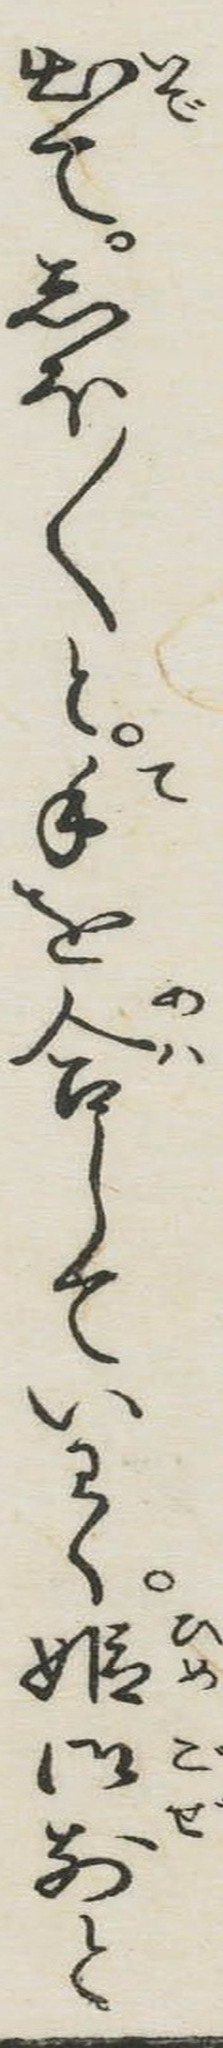出て。しほ〳〵と。手を合していわく。姫御前と
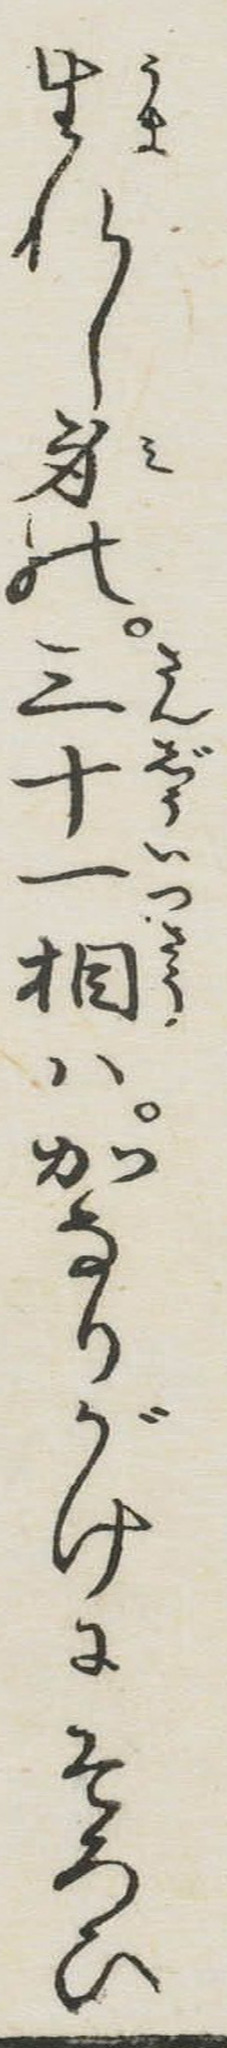生れし身の。三十一相は。かなりがけにそろひ
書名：福神おしへの小槌 2巻 上
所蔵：東京学芸大学教育コンテンツアーカイブ
